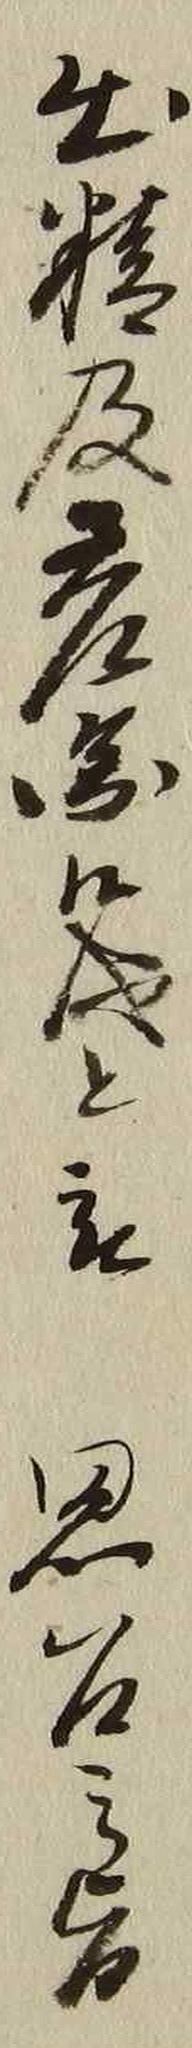出精及差図候儀と被思名之旨
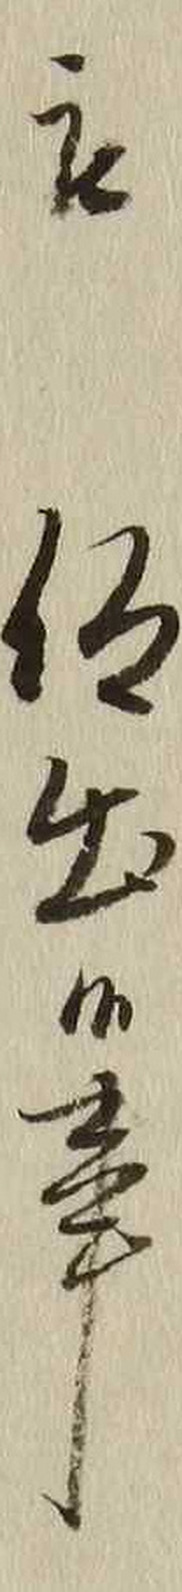被仰出候事
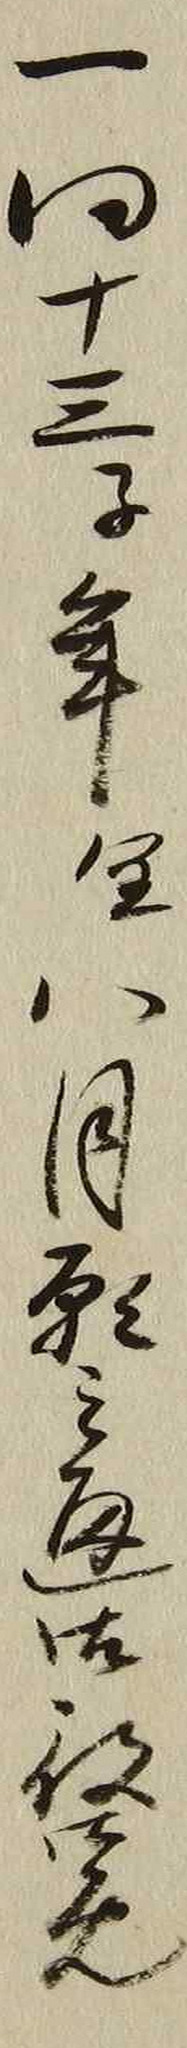一同十三子年閏八月願之通御役御免
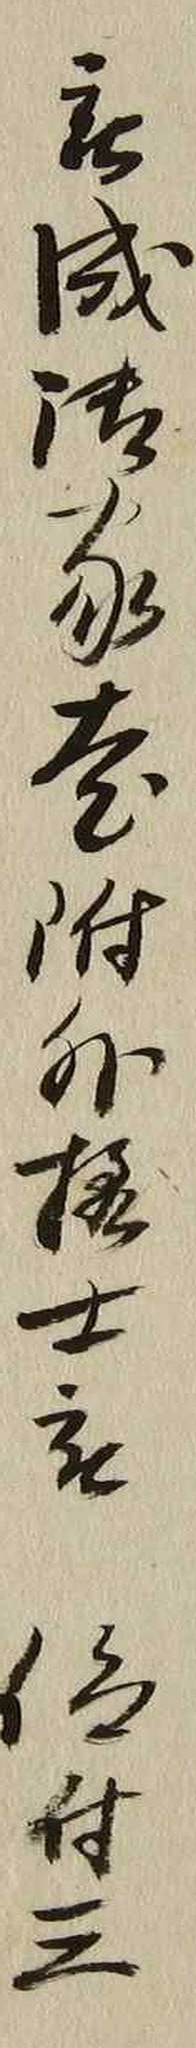被成御家老附外様士被仰付三
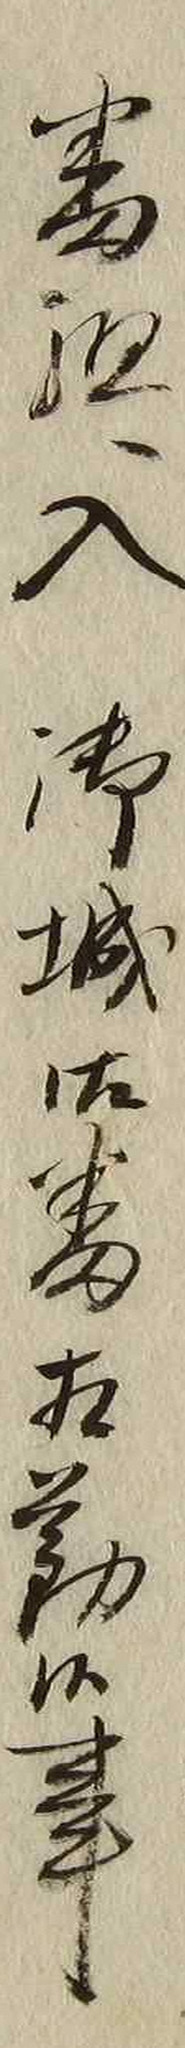番組へ入御城御番相勤候事
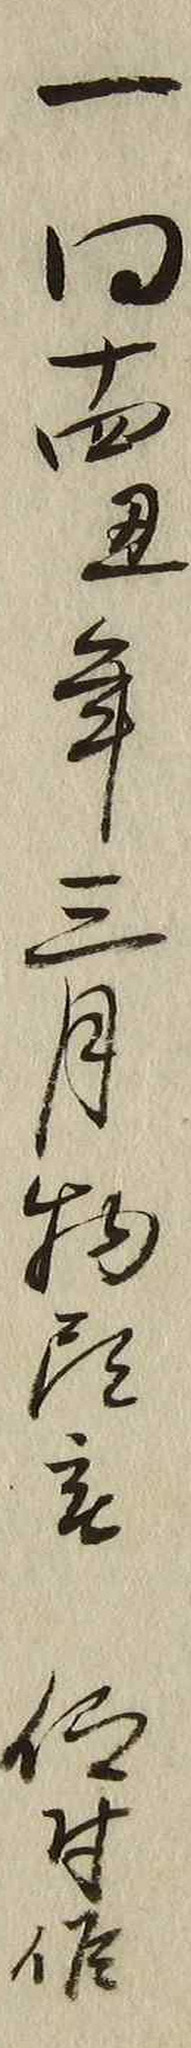一同十四丑年三月物頭被仰付候
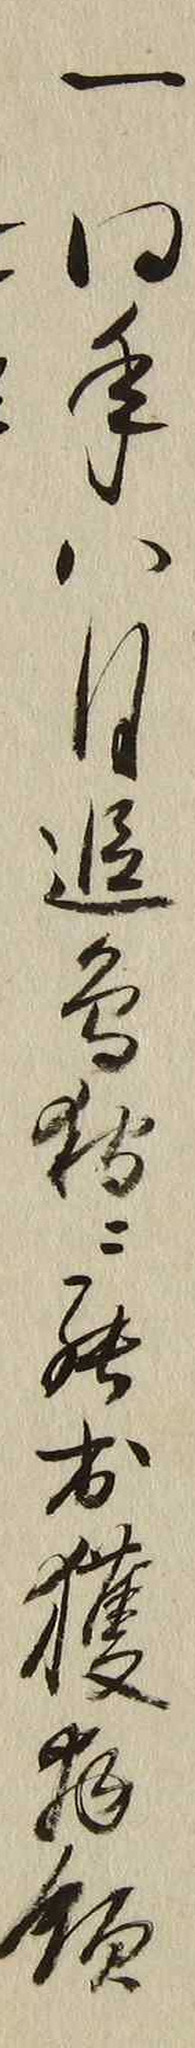一同年八月追鳥狩ニ罷出獲拝領
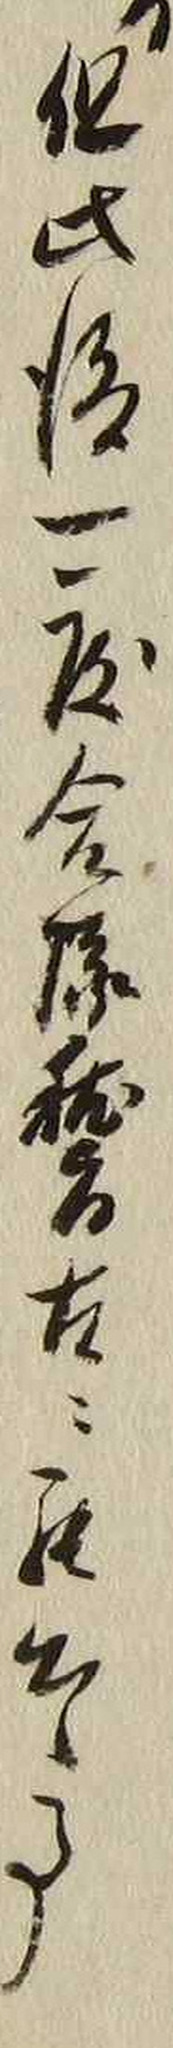但此後一度合隊稽古ニ罷出候事
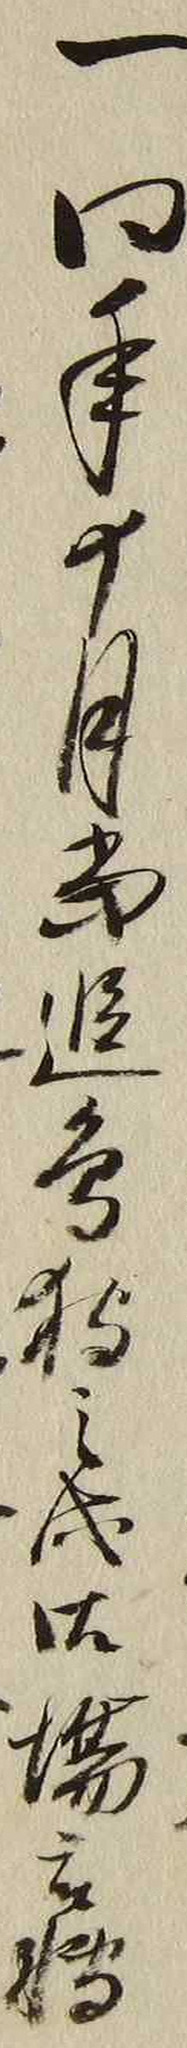一同年十月当追鳥狩之儀御場被転
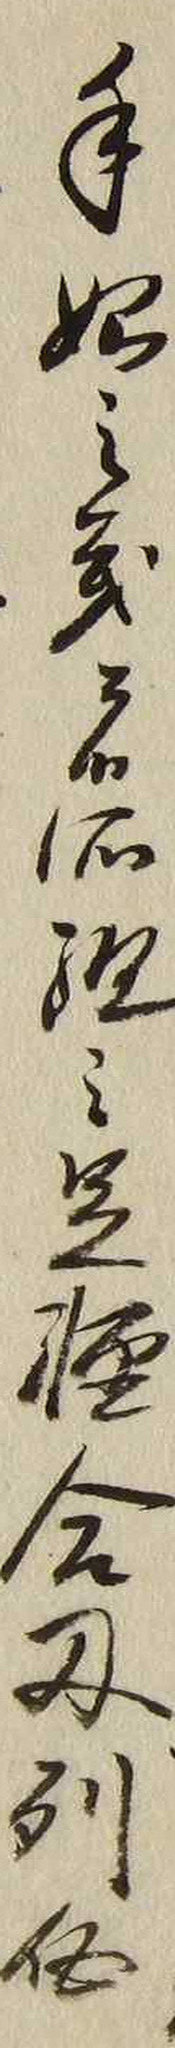手始之義ニ候所組之足軽合刃列伍
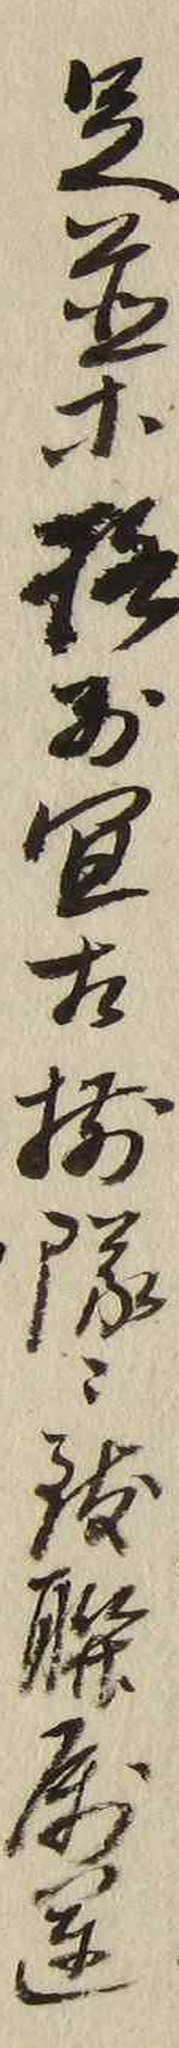足並等格別宜相揃隊々致聯属運
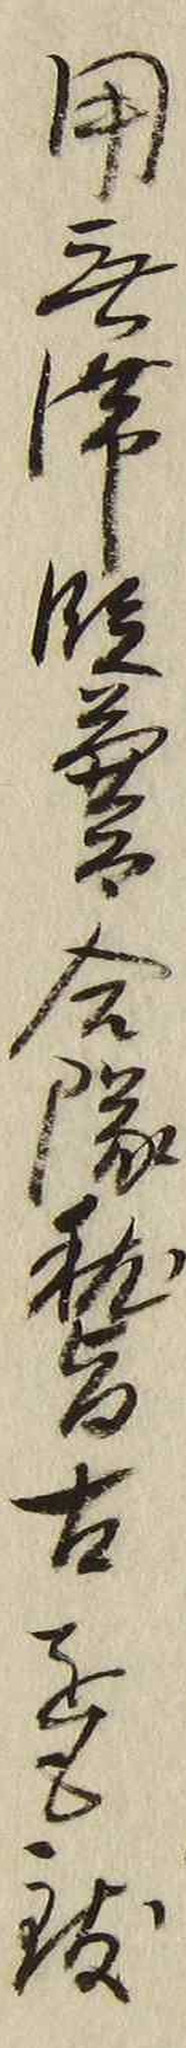用無滞段兼而合隊稽古をも致

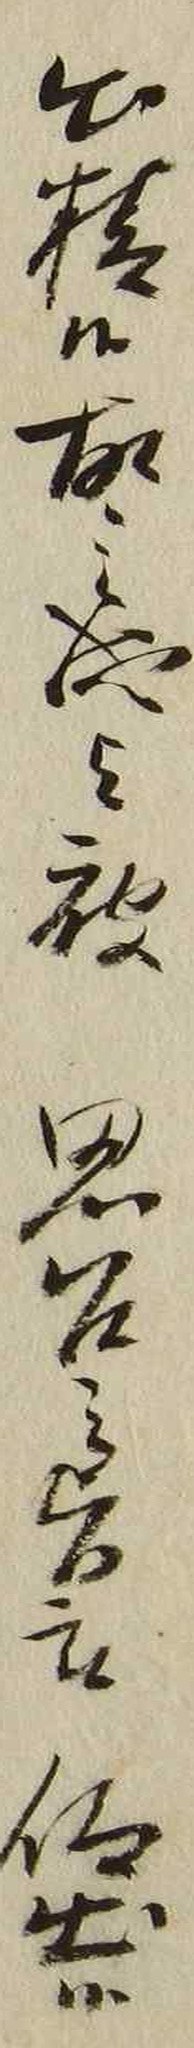出精候故之儀与被思召之旨被仰出候
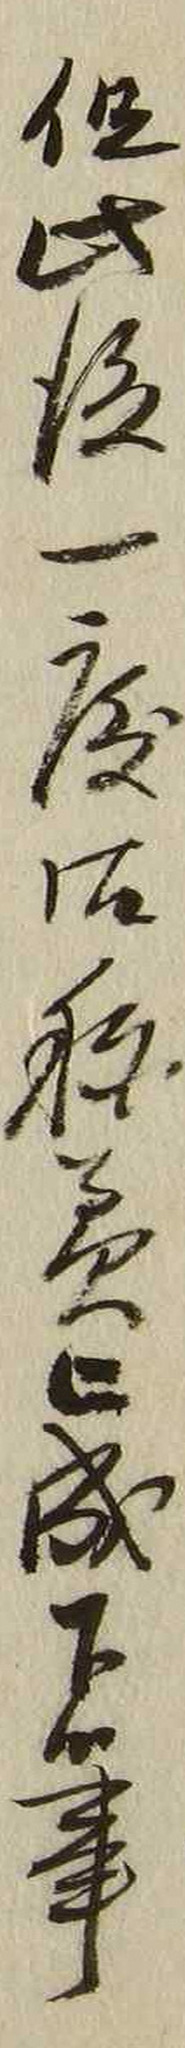但此後一度御称美被成下候事
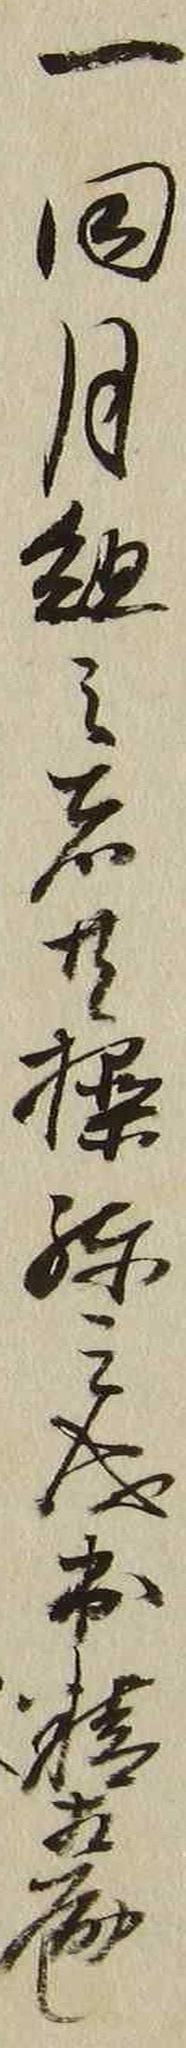一同月組之者共操練之儀出精相励
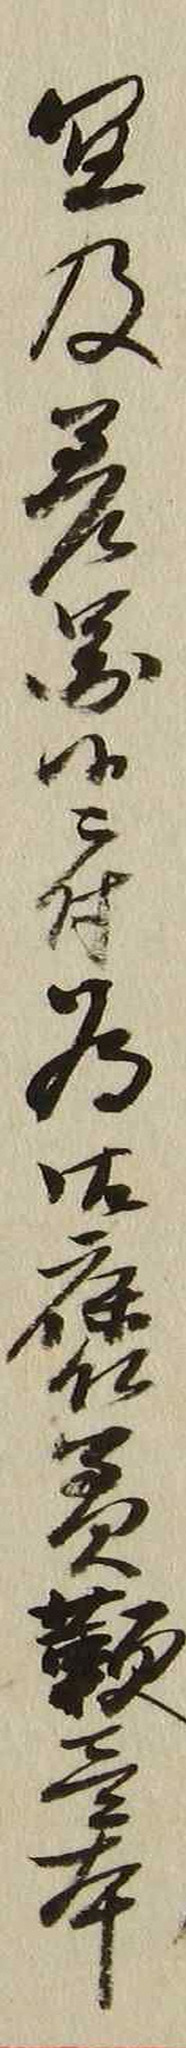宜及差図候ニ付為御褒美鞭壱本
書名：諸士系譜　巻之355　す之部5
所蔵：会津若松市立会津図書館
